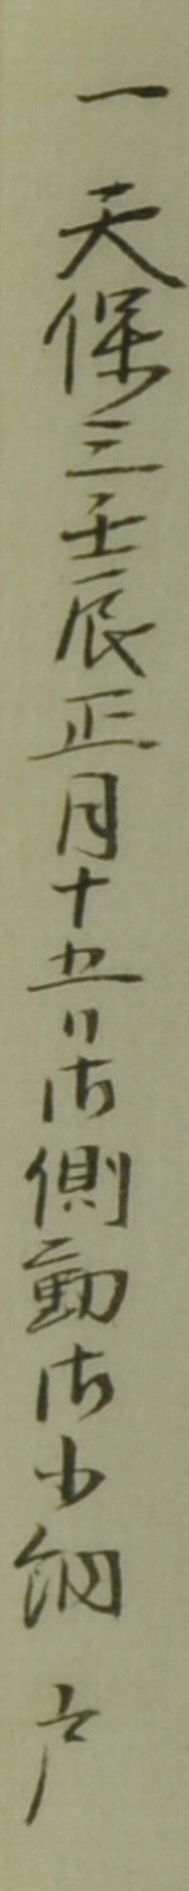一天保三壬辰正月十五日御側勤御小納戸

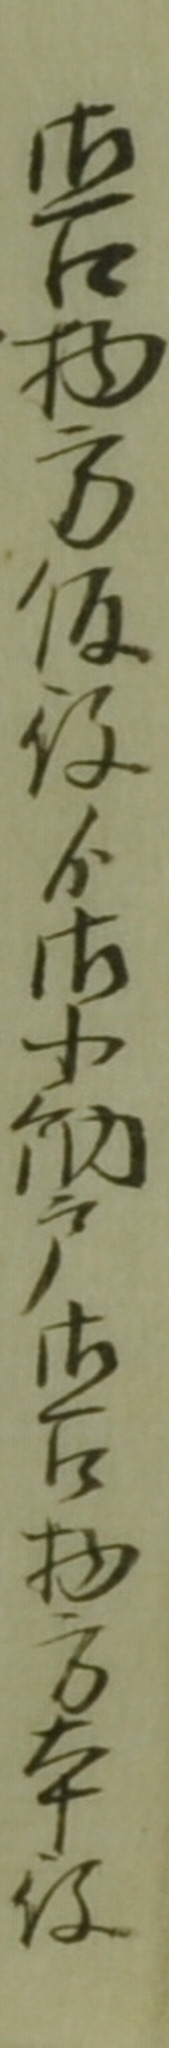御召物方仮役ゟ御小納戸御召物方本役
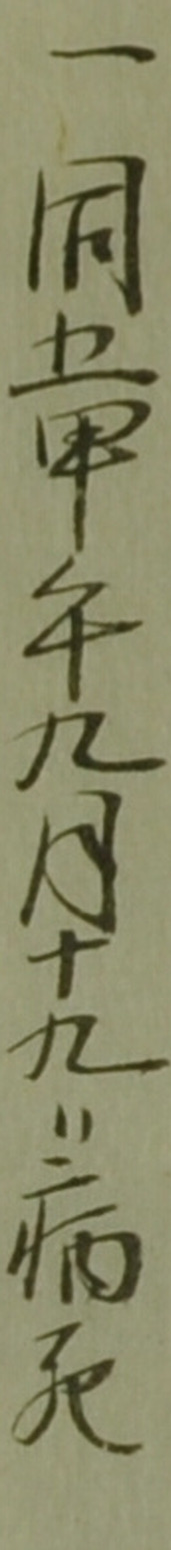一同五甲午九月十九日病死
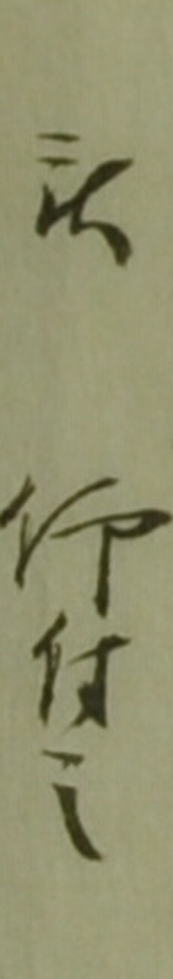被仰付之
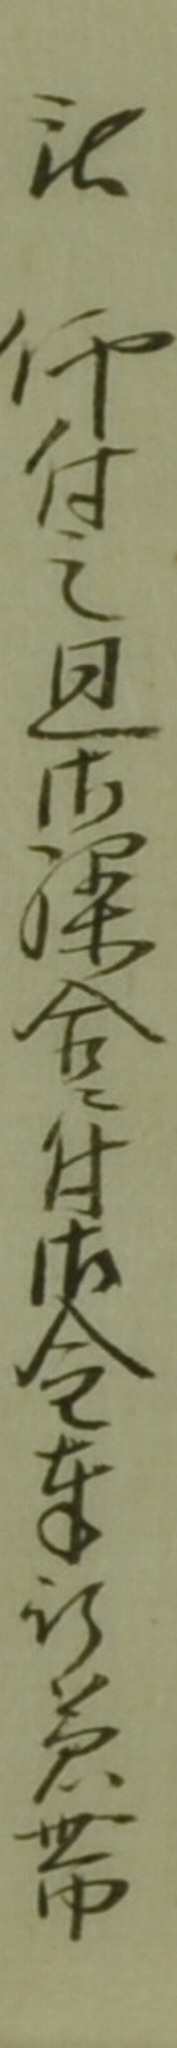被仰付之且御繰合付御金奉行兼帯
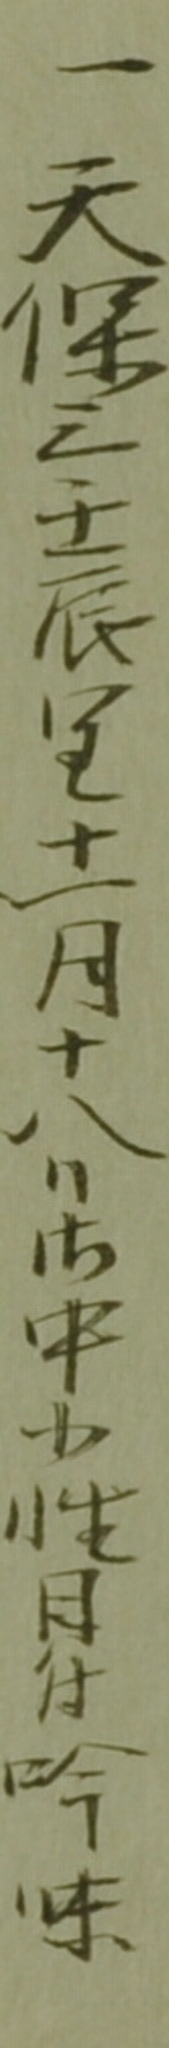一天保三壬辰閏十一月十八日御中小性目付吟味
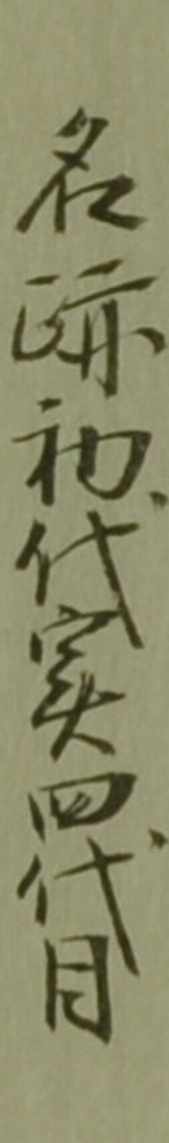名跡初代実四代目
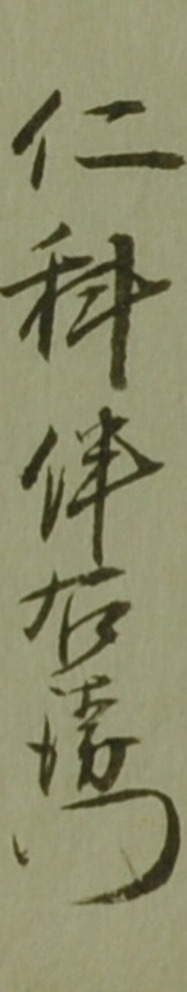仁科伴右衛門
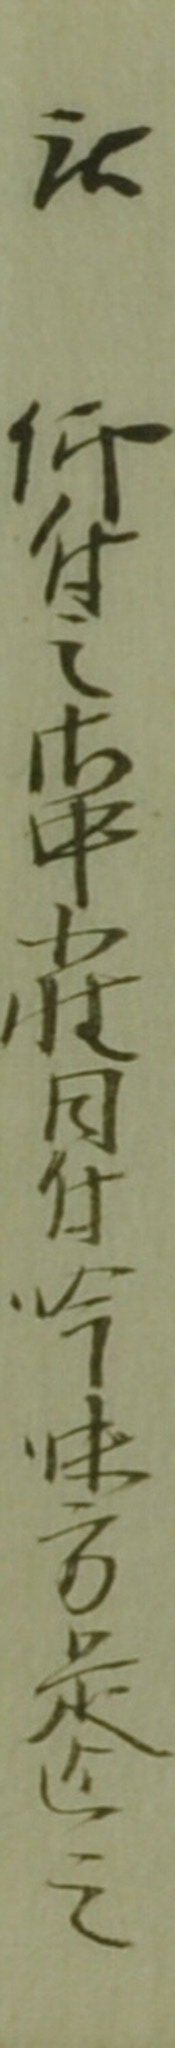被仰付之御中小性目付吟味方是迄之
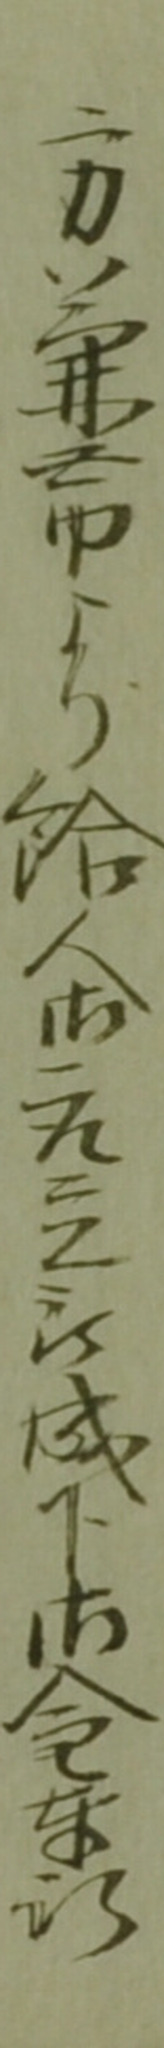方兼帯より給人御取立被成下御金奉行
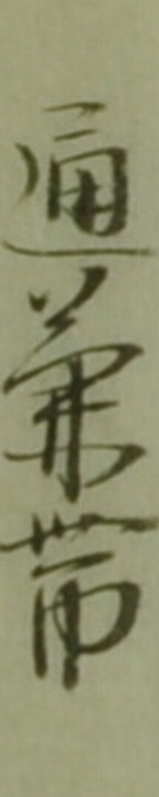通兼帯
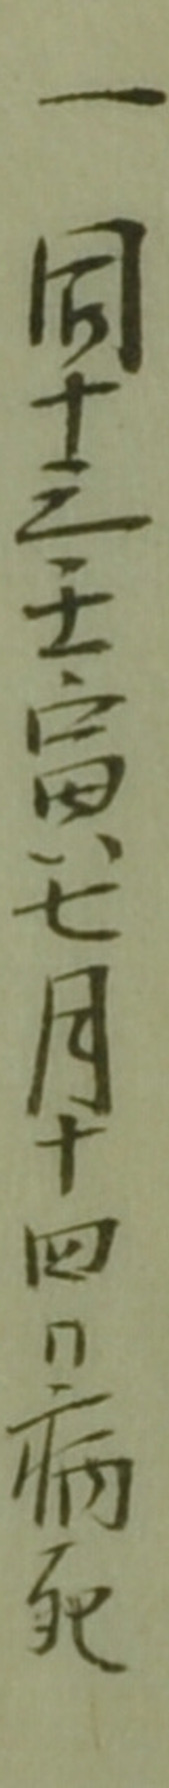一同十三壬寅七月十四日病死
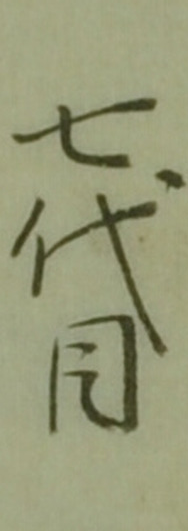七代目
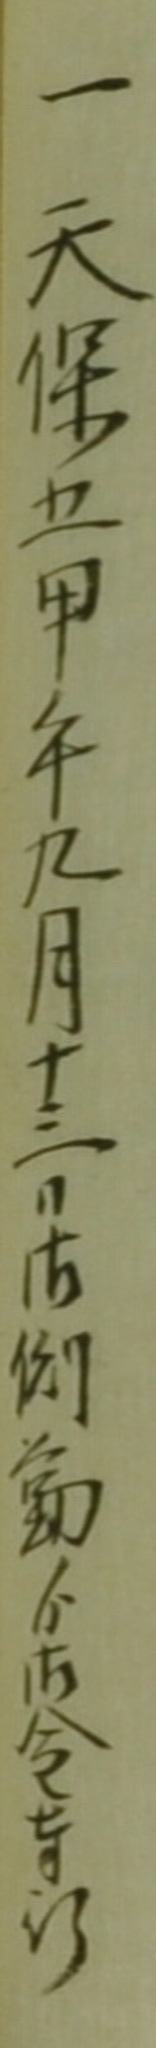一天保五甲午九月十三日御側勤ゟ御金奉行
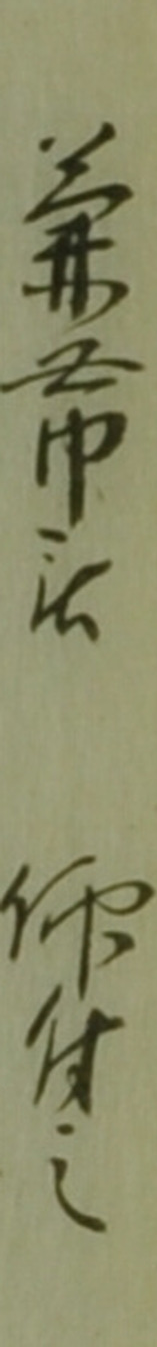兼帯被仰付之
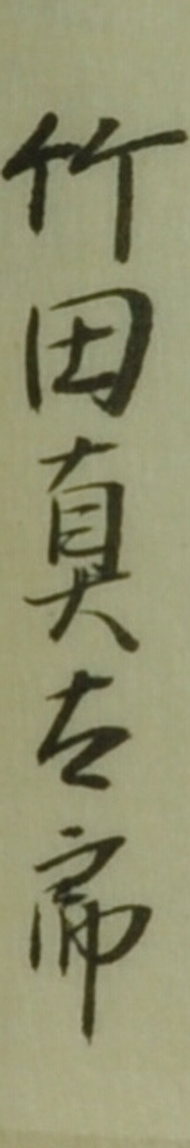竹田真太郎
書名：諸御役代々録（七）
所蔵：伊那市立高遠町図書館・合同会社AMANE
